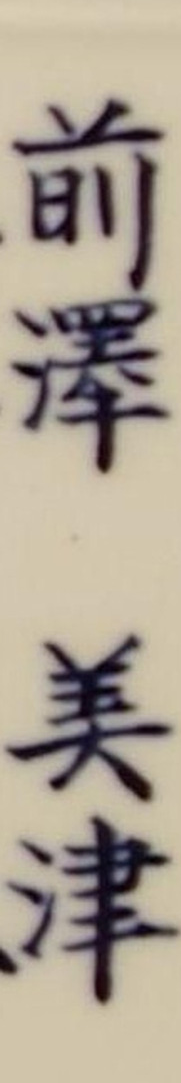前沢美津
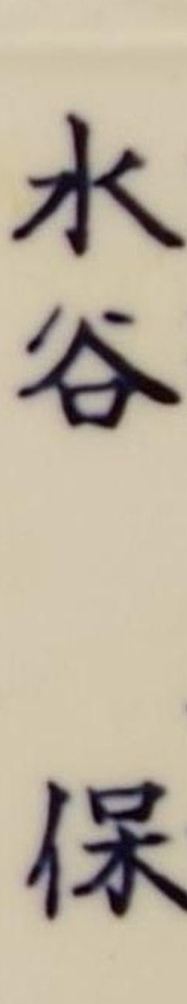水谷保
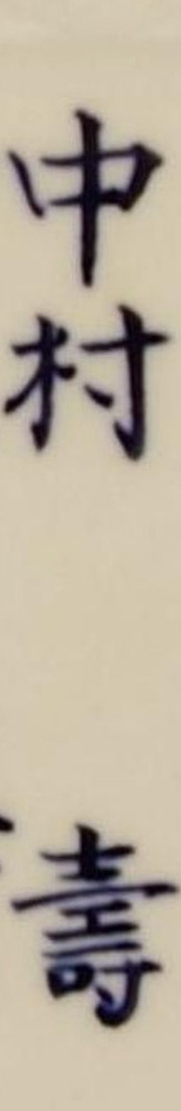中村壽
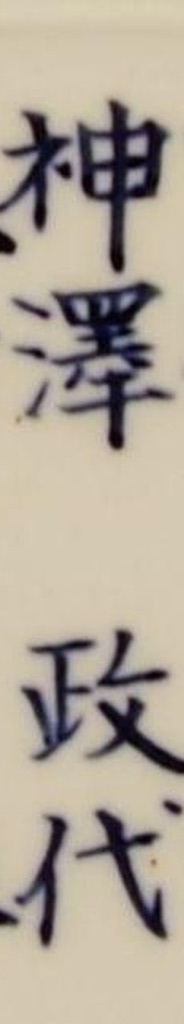神澤政代
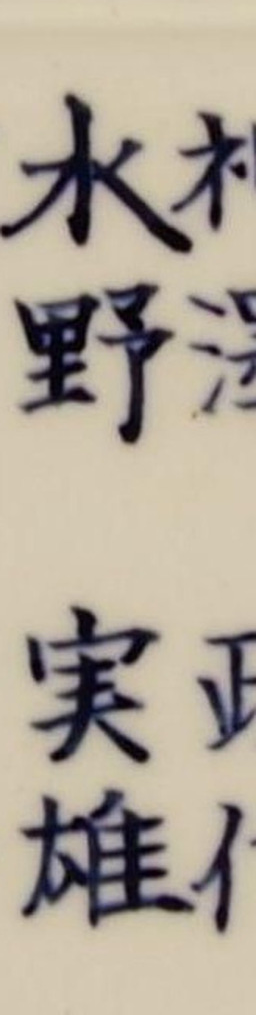水野実雄
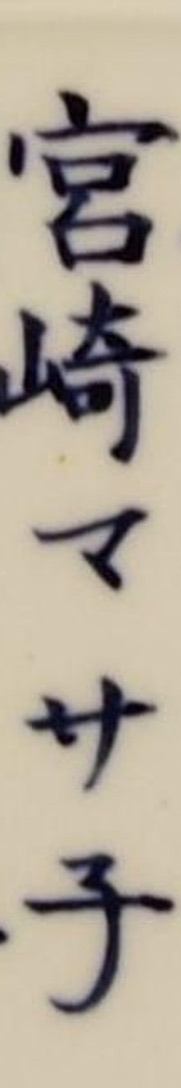宮崎マサ子
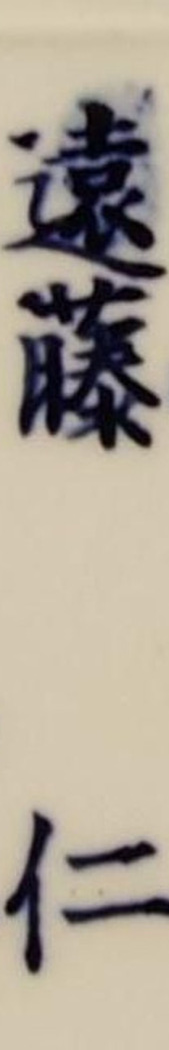遠藤仁
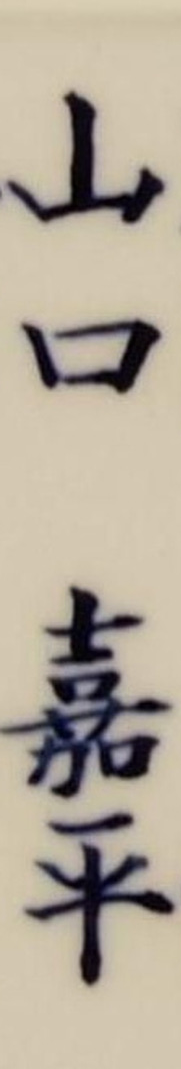山口嘉平
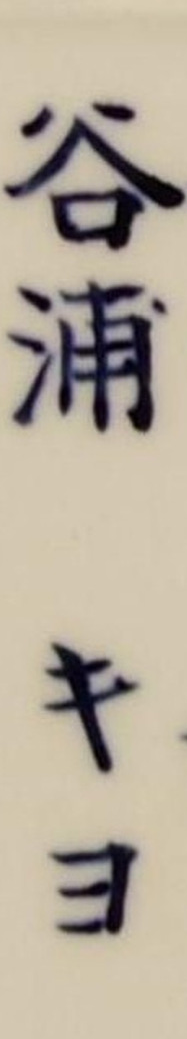谷浦キヨ
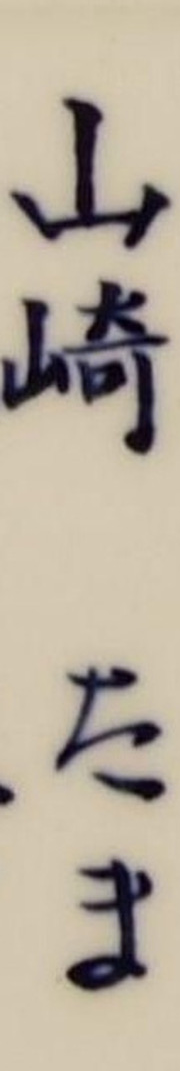山崎たま
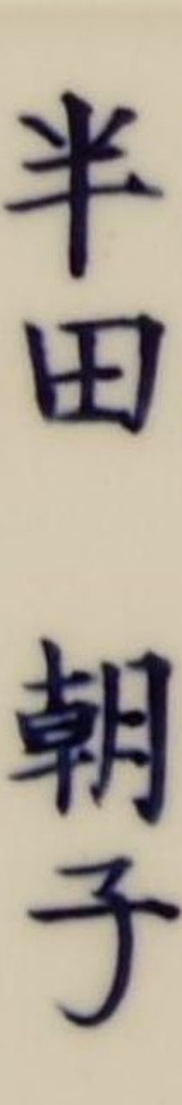半田朝子
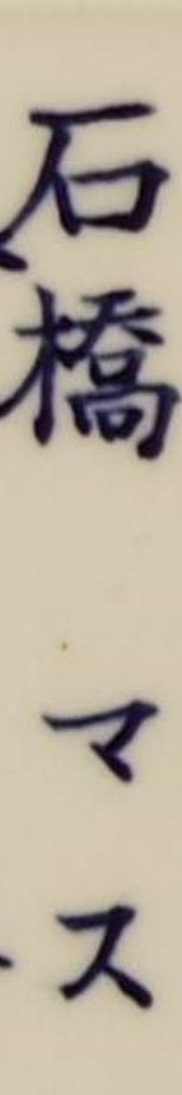石橋マス
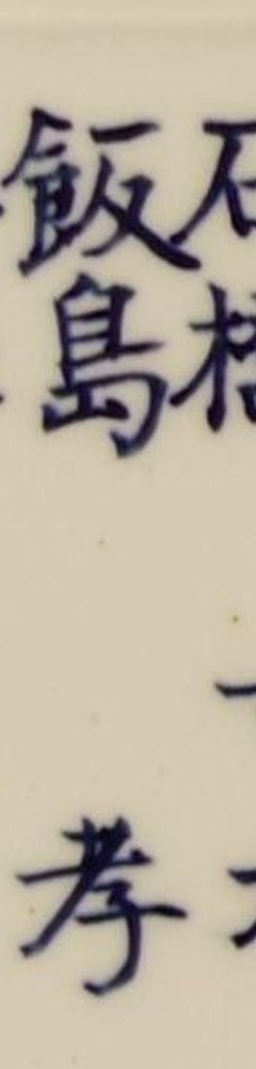飯島孝
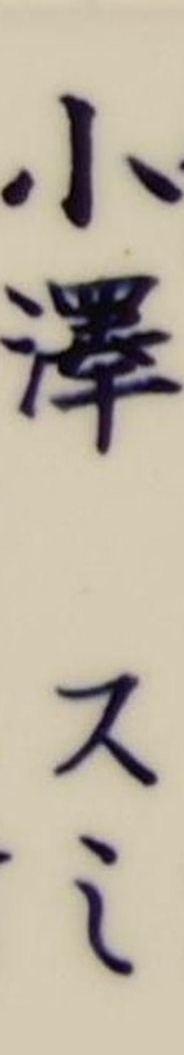小澤スミ
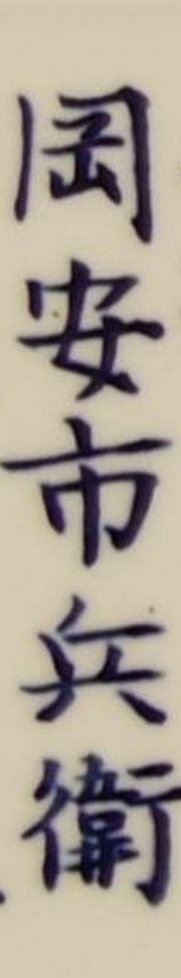岡安市兵衛
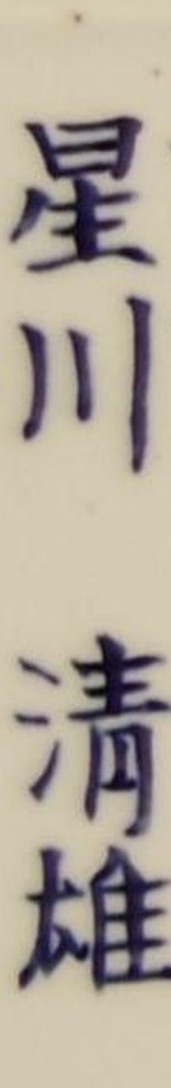星川清雄
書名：A~D
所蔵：koyasan kongobuji
